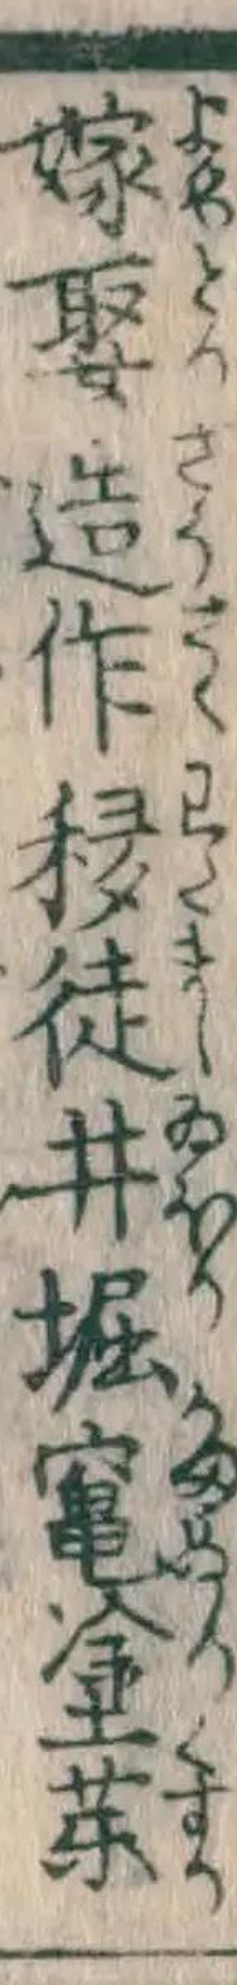嫁娶造作移徒井掘竈塗薬
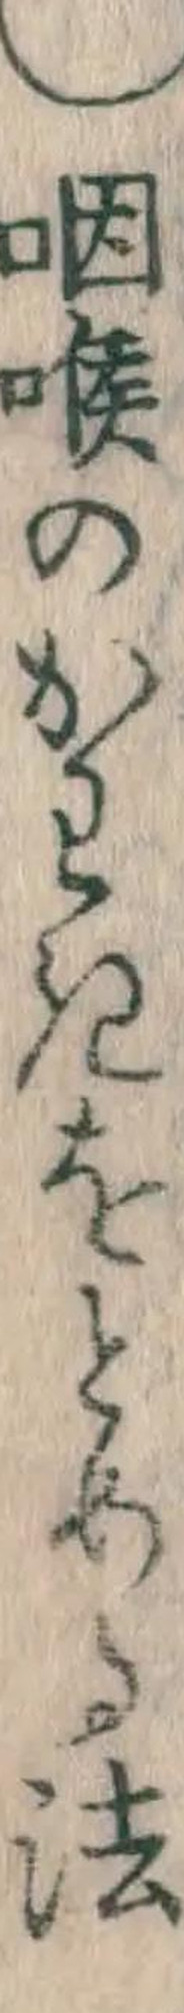○咽喉のかわきをとめる法
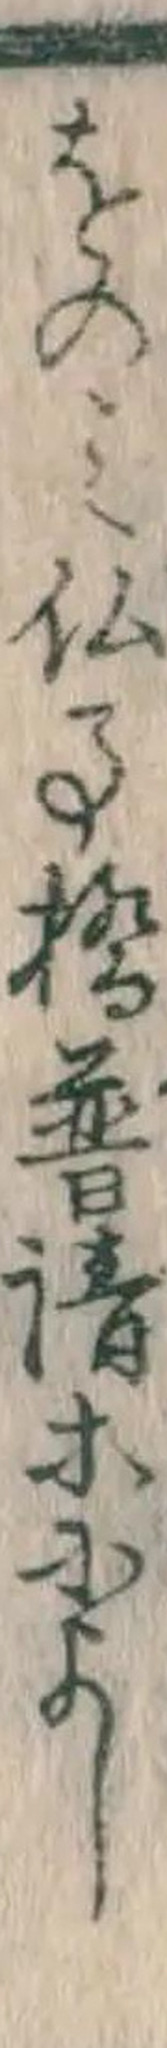をのみ仏事橋普請等によし
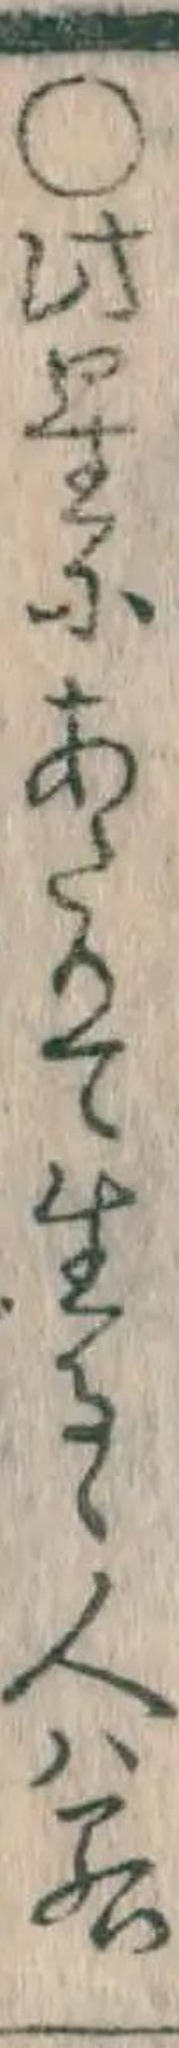○此星にあたりて生るゝ人は若
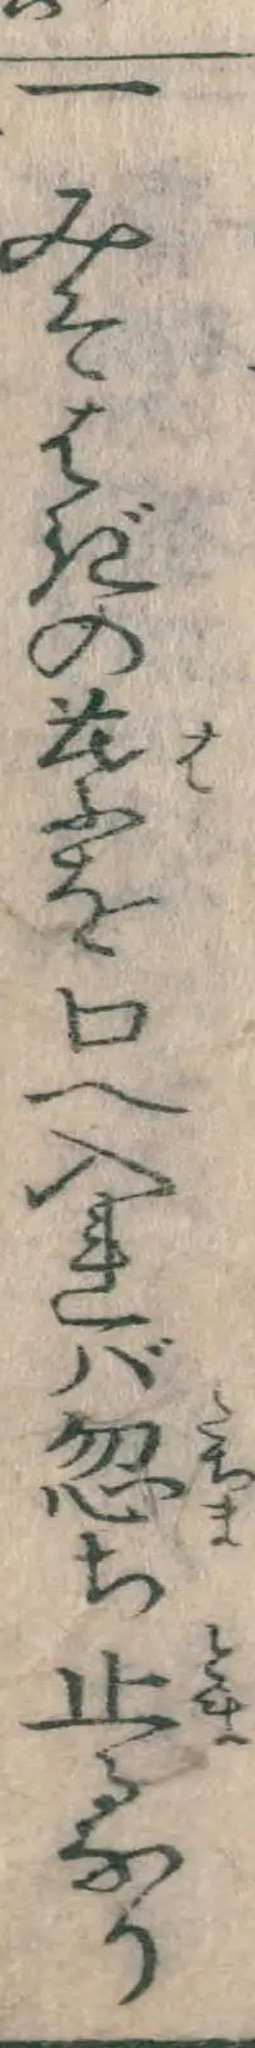一みそはぎの葉を口へ入れば忽ち止るなり
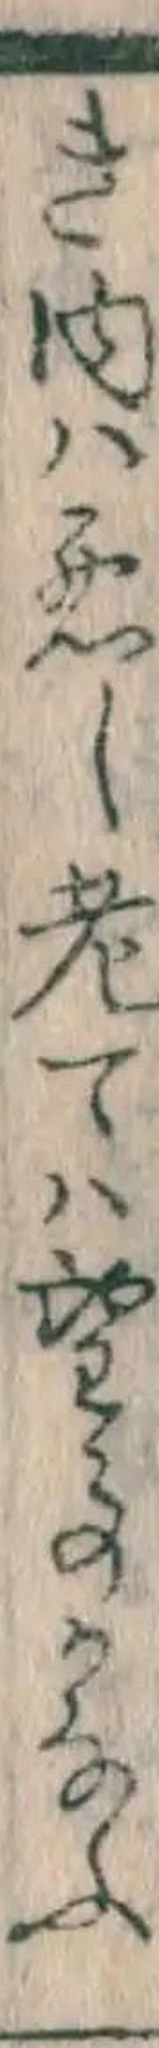き内は悪し老ては望事かなふ
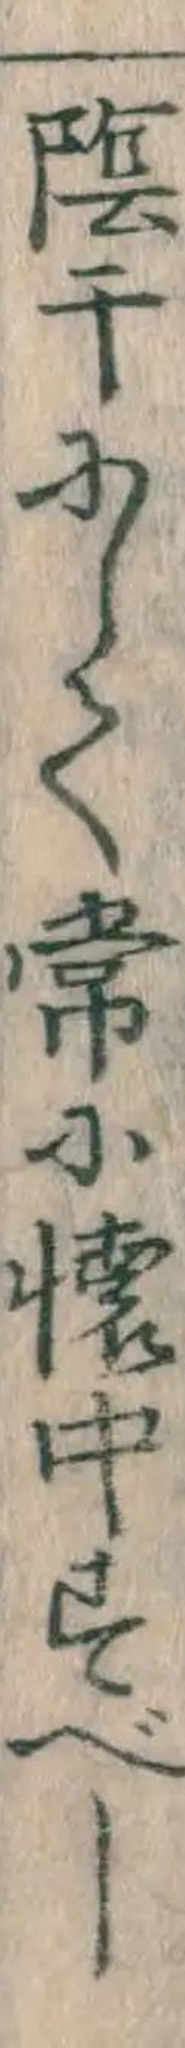陰干にして常に懐中すべし

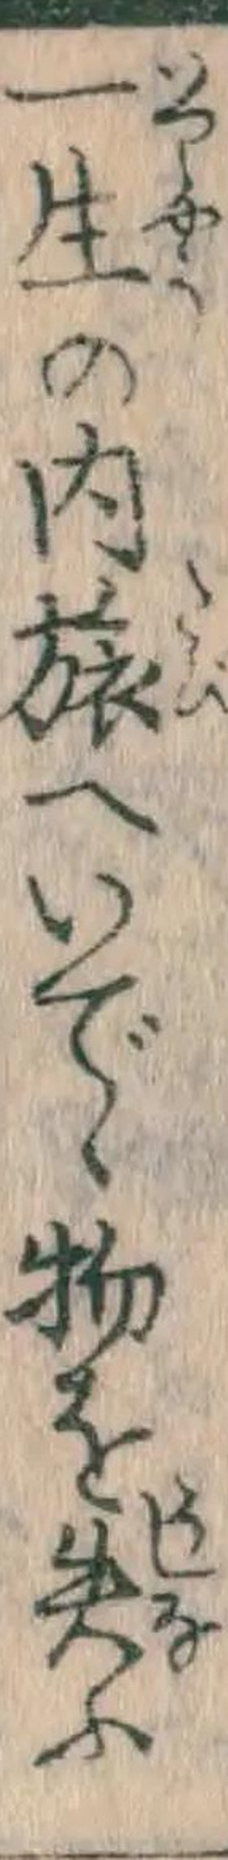一生の内旅へいでゝ物を失ふ
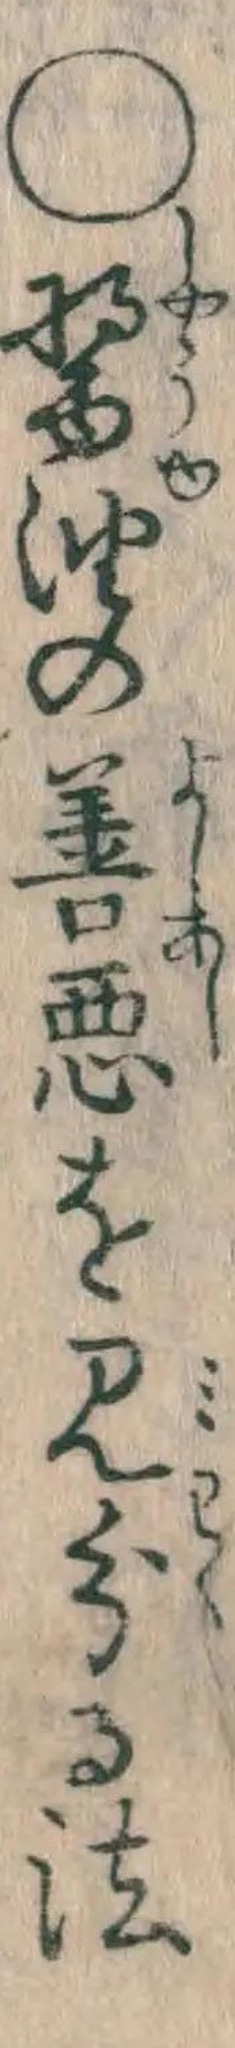○醬油の善悪を見分る法
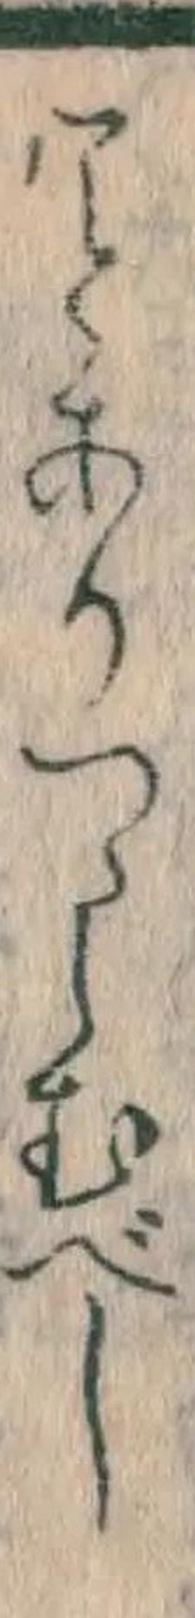ことありつゝしむべし
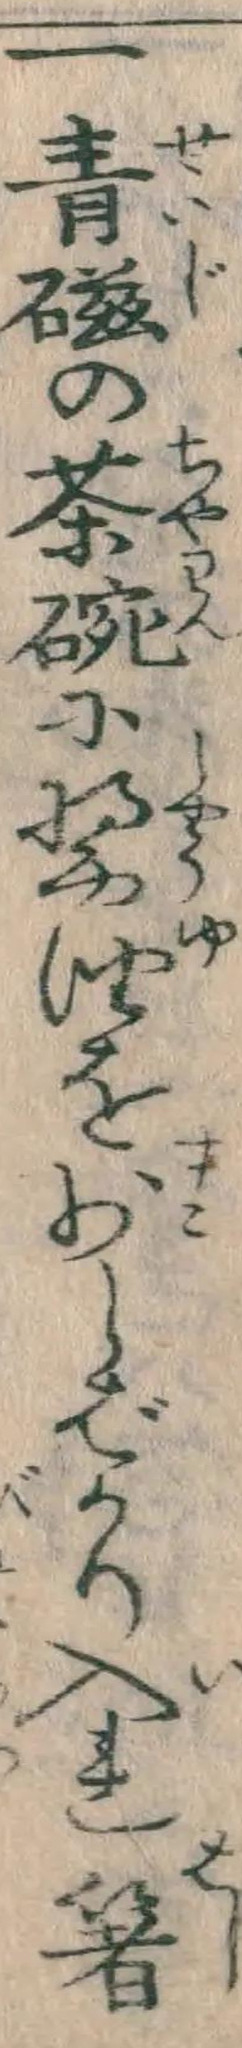一青磁の茶碗に醬油を少しばかり入れ箸
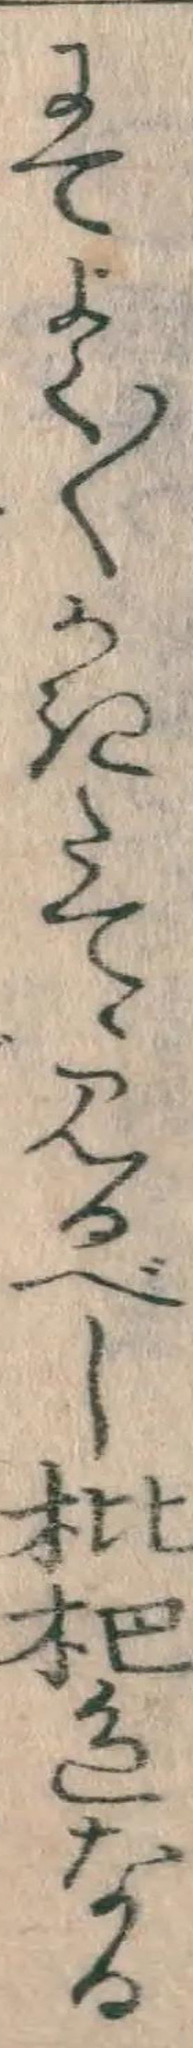にてよく〳〵かきたてゝ見るべし枇杷色なる
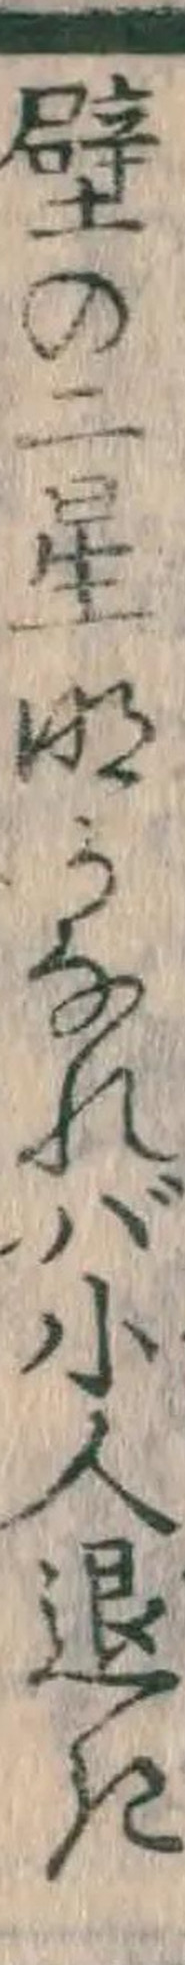壁の二星明かなれば小人退き
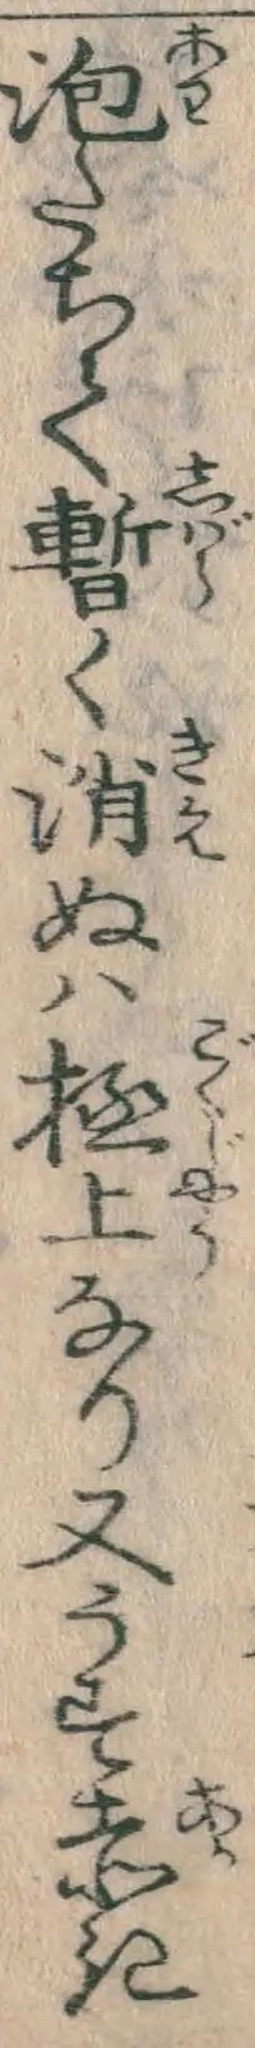泡たちて暫く消ぬは極上なり又うす赤き
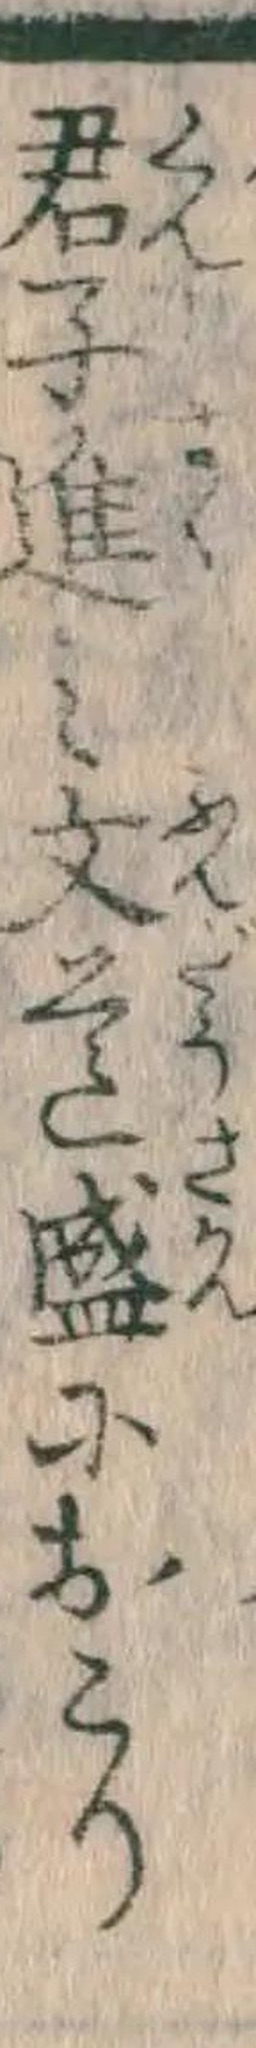君子進み文道盛におこり
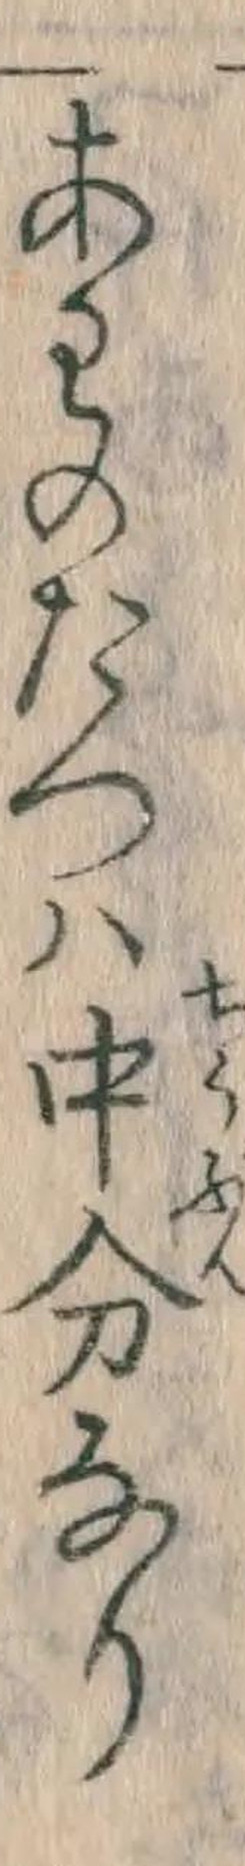あわのたつは中分なり
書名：広益秘事大全 3巻. [2]
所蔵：国立国会図書館 National Diet Library, JAPAN
